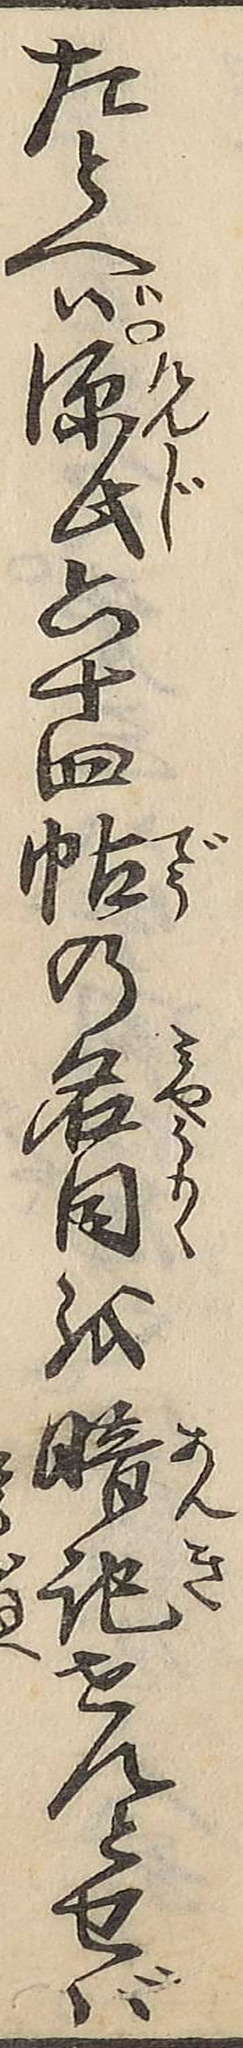たとへば。源氏六十四帖の名目を暗記せんとせば
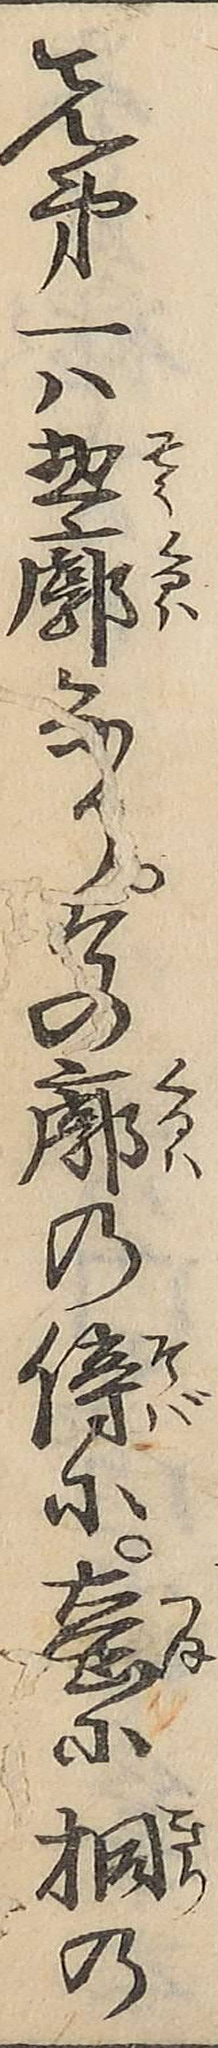先第一は惣廓なり。その廓の傍に。壺に桐の

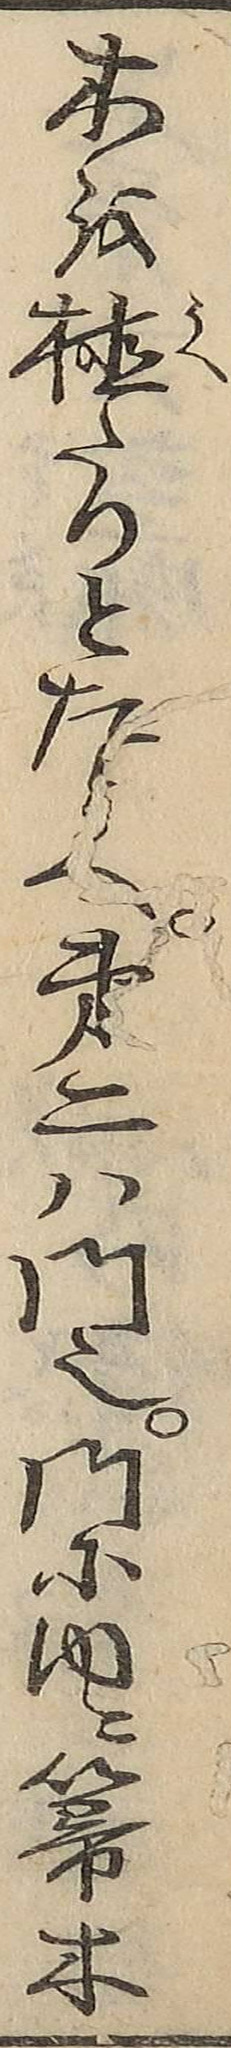木を植たりとたとへ。第二は門也。門に内に箒木
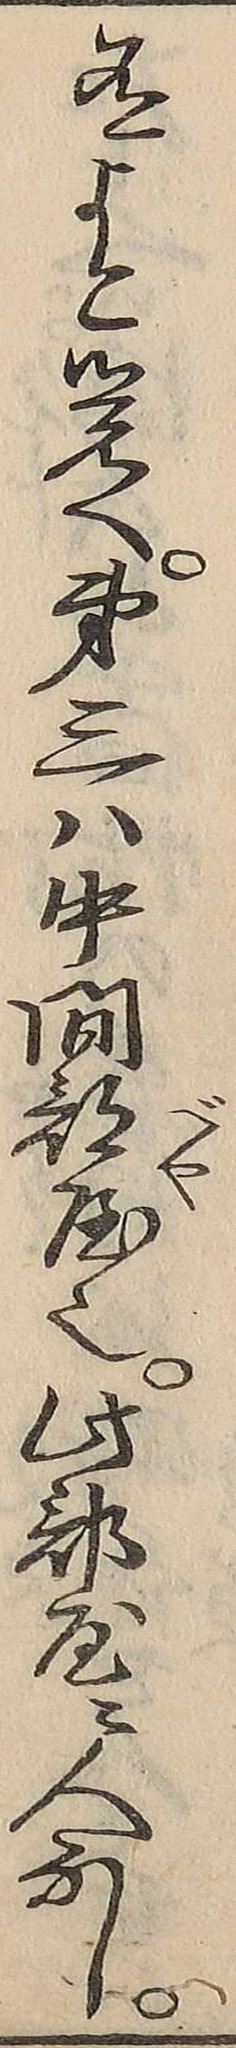有よと覚へ。第三は中間部屋也。此部屋に人なし。
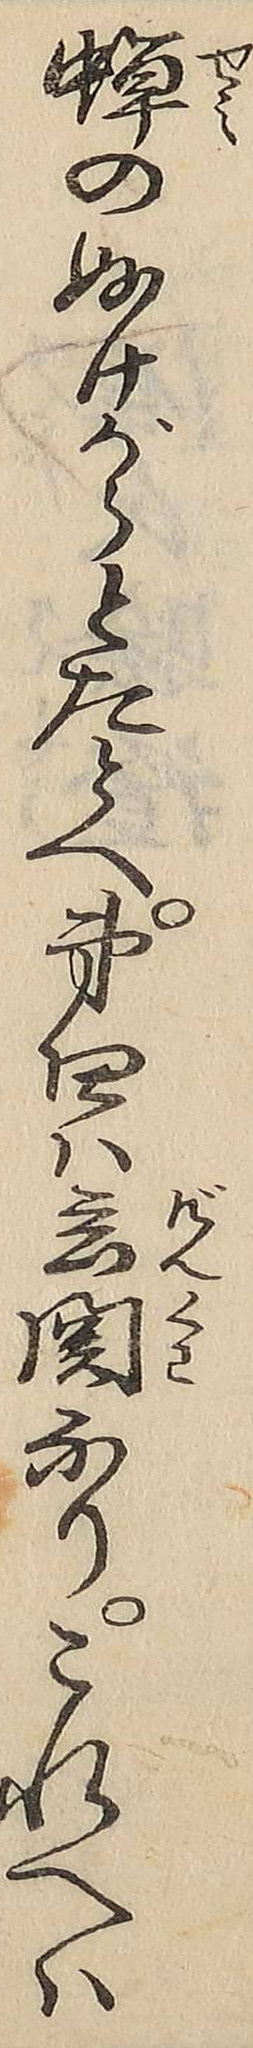蝉のぬけがらとたとへ。第四は玄関なり。これへは
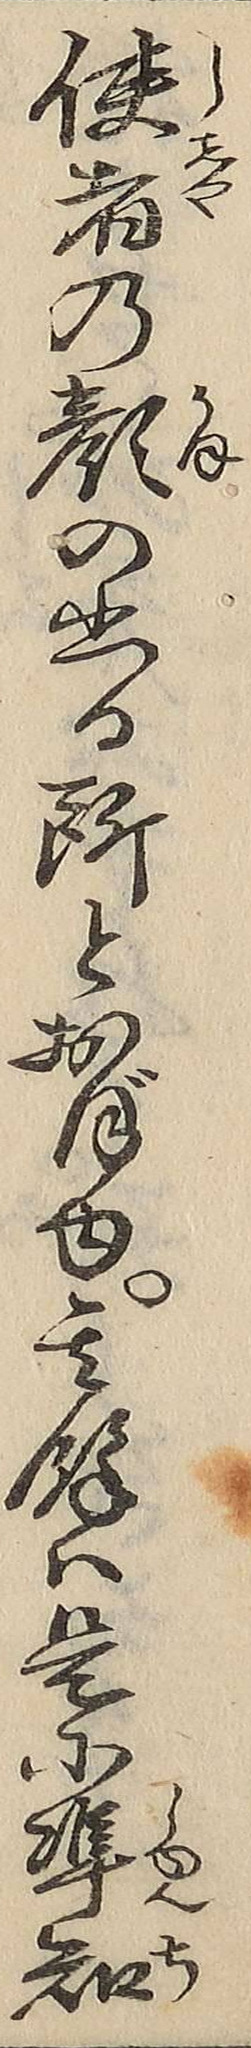使者の顔の出る所とおぼゆ。其餘は是に準知
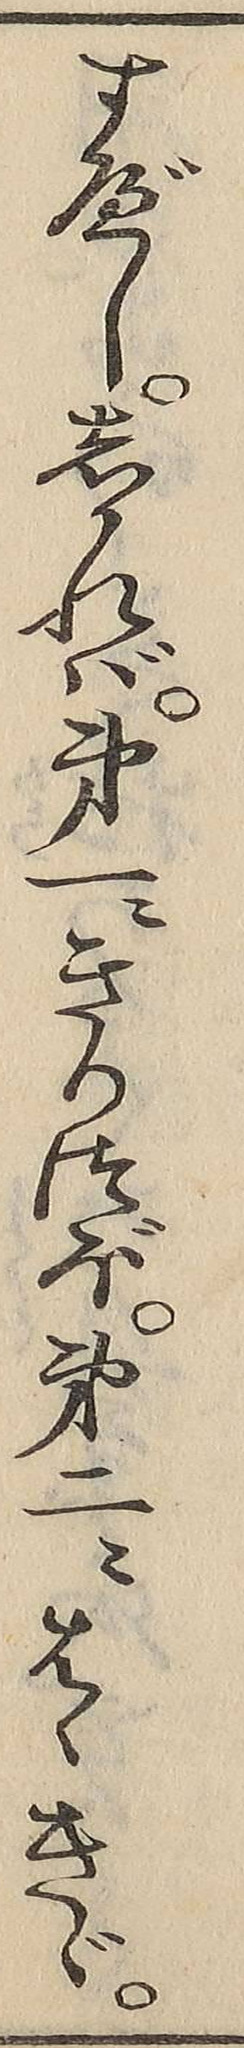すべし。しかれば。第一にきりつぼ。第二にはゝきゞ。
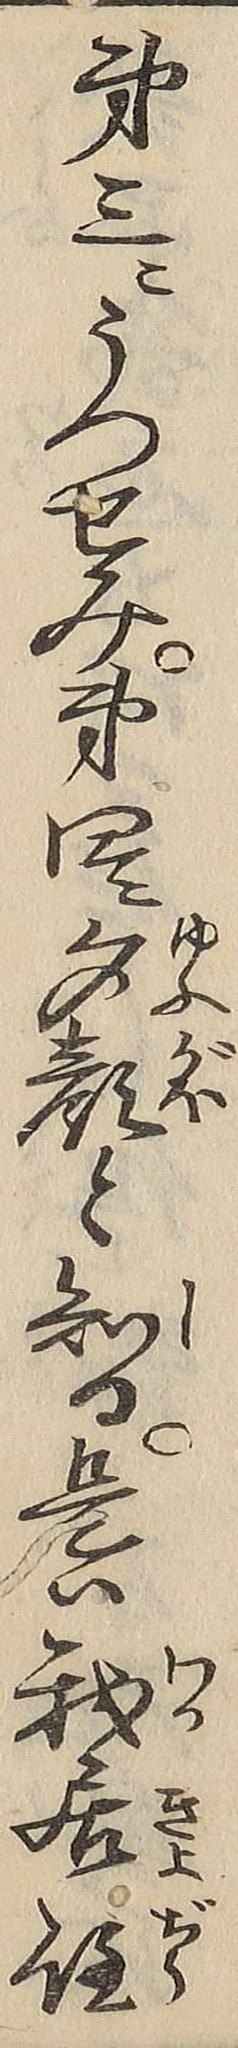第三にうつせみ。第四に夕顔と知る。是は我居住
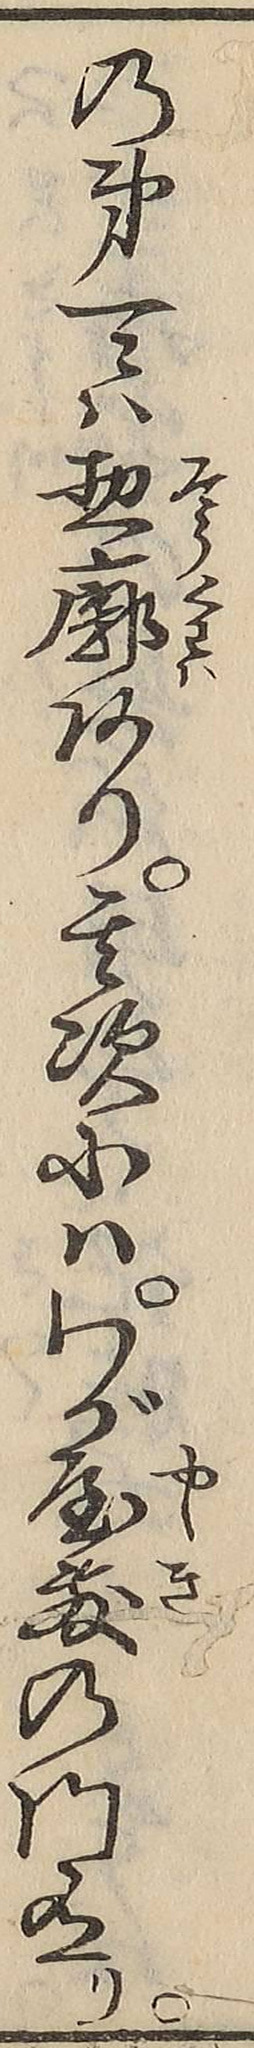の第一には惣廓あり。其次には。わが屋敷の門有り。
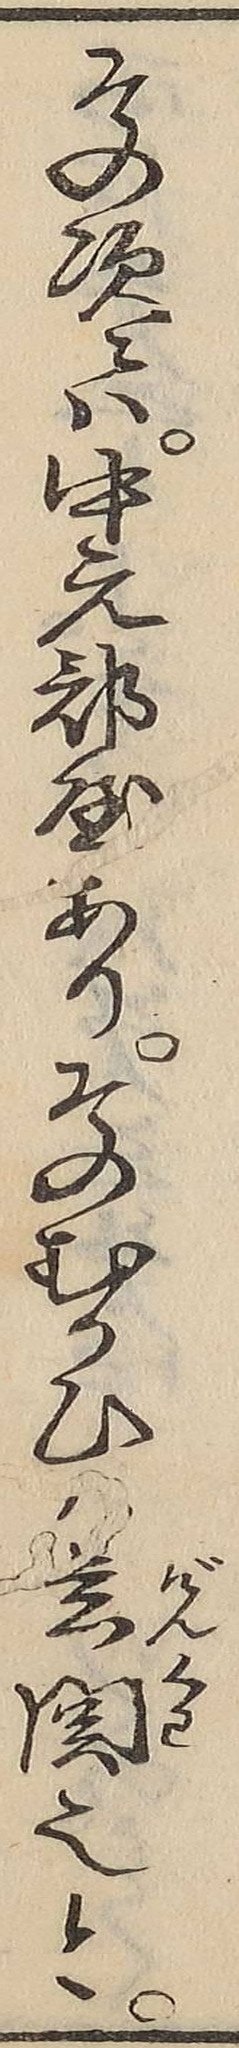その次には。中元部屋あり。そのむかひは玄関也と。
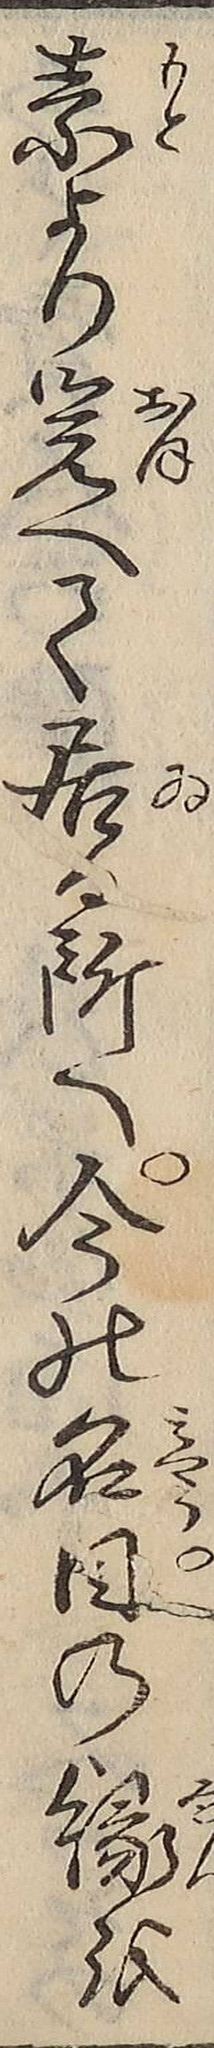素より覚へて居る所へ。今の名目の縁を
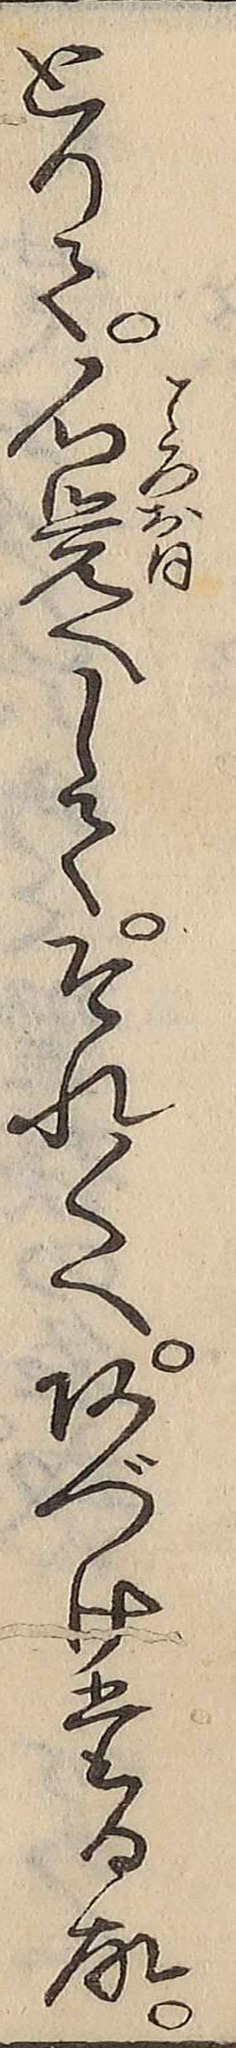とりて。心覚へして。それ〳〵へ。あづけたる故。
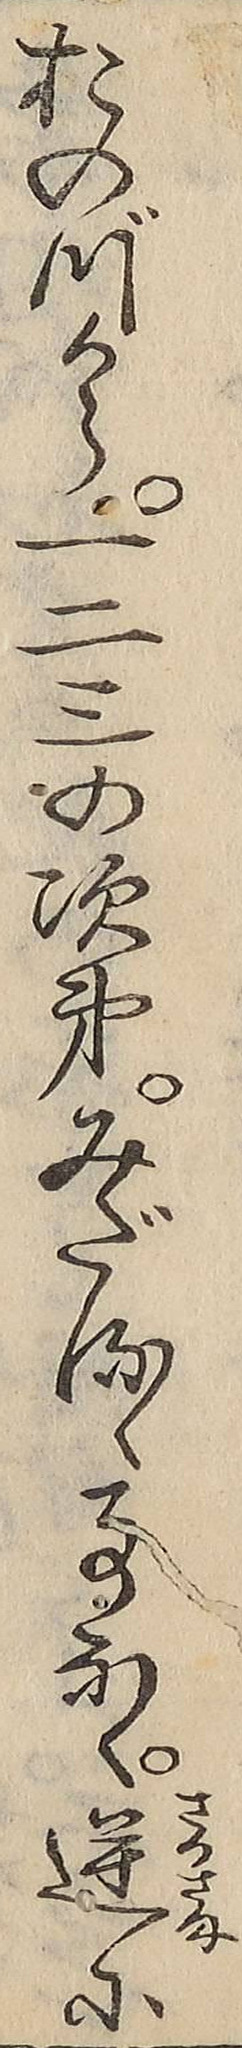おのづから。一二三の次第。みだるゝ事なく。逆に
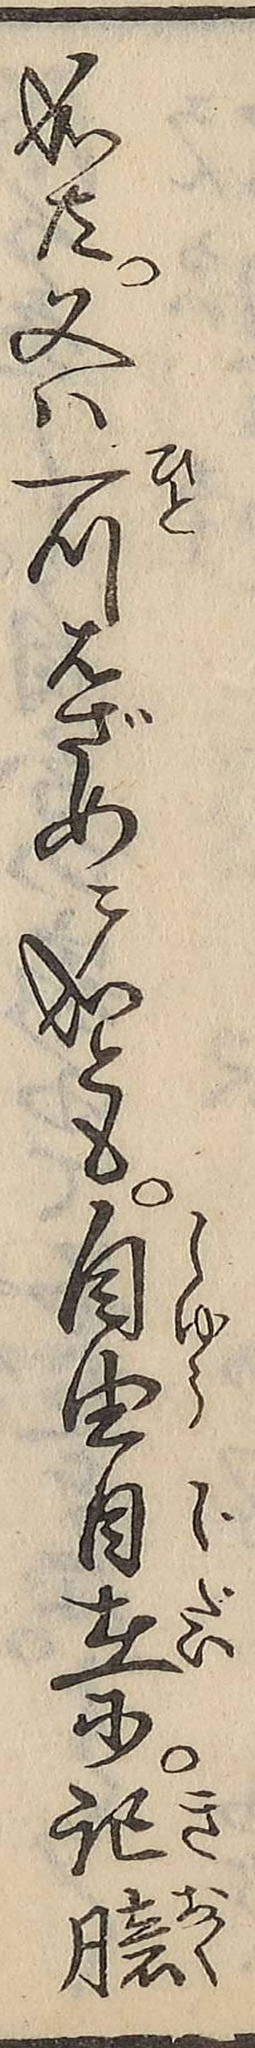成共。又は一つはざめに成とも。自由自在に。記臆
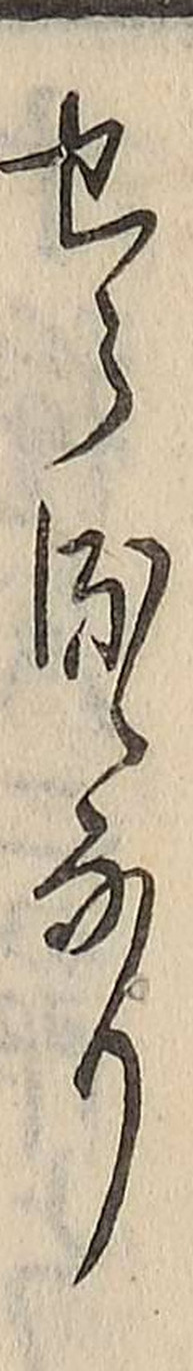せらるゝなり
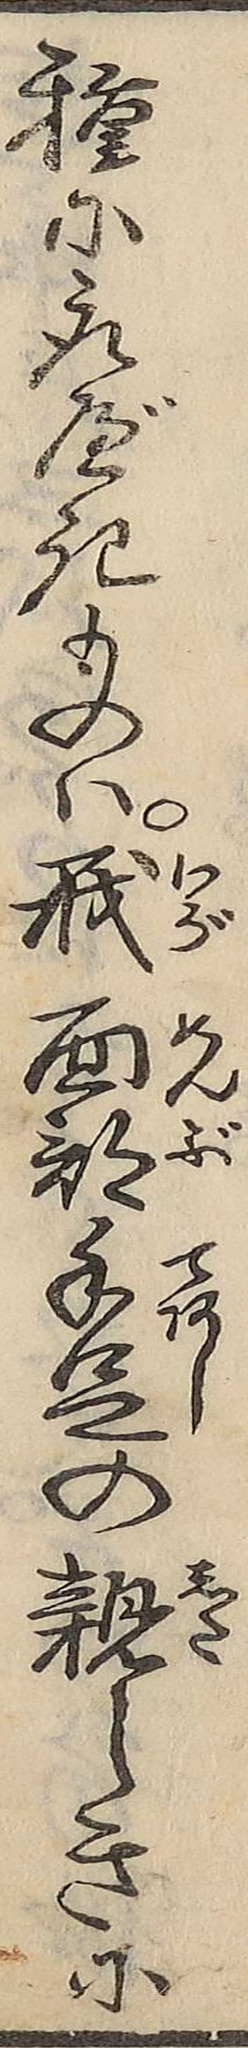種に取べきものは。我面部手足の親しきに
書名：物覺秘傳
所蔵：神戸大学附属図書館 国文学研究資料館
